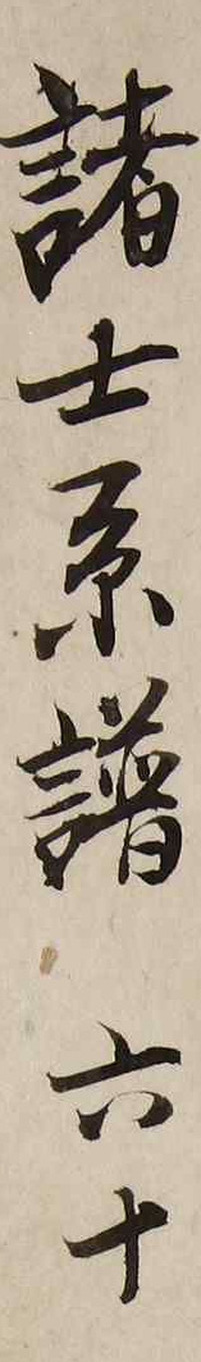諸士系譜六十

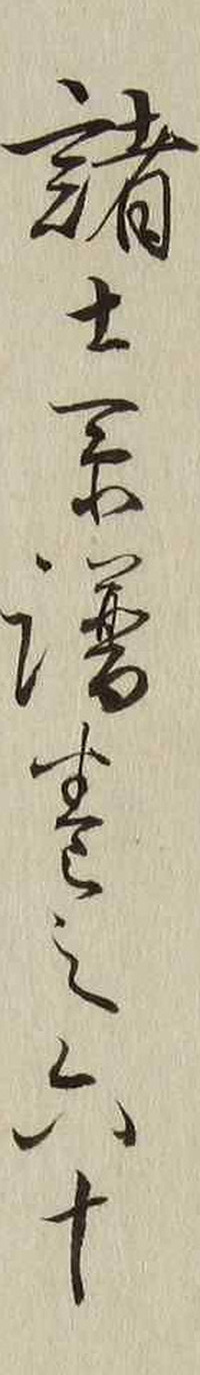諸士系譜巻之六十
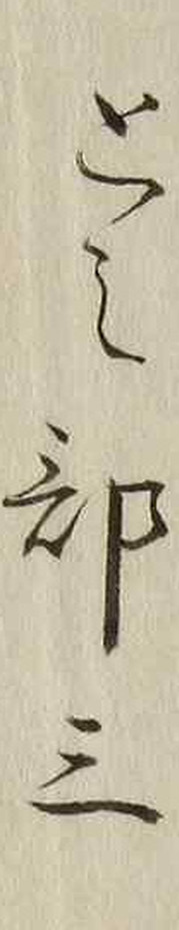と之部三
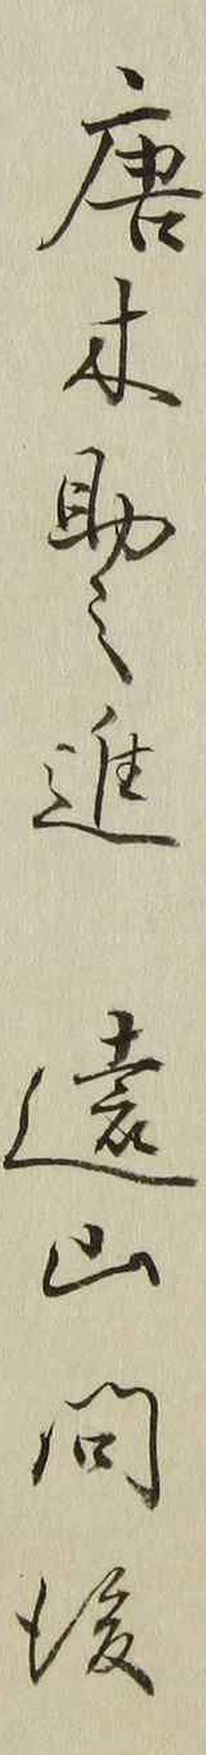唐木助之進遠山問後

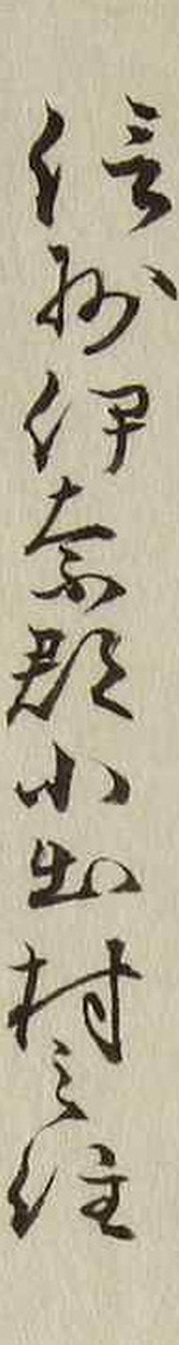信州伊奈郡小出村之住
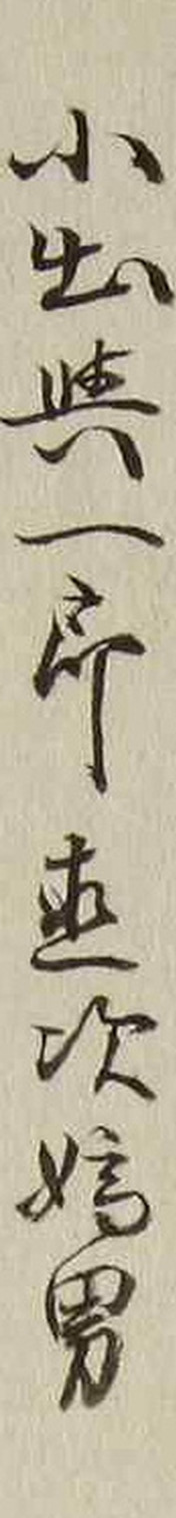小出與一郎直次嫡男
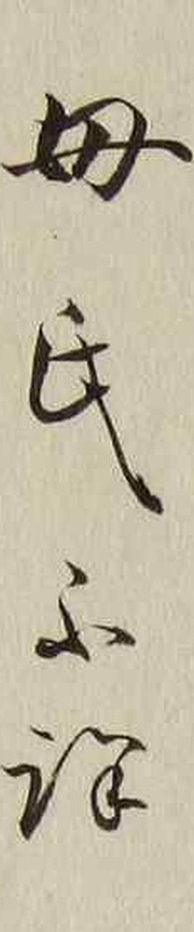母氏不詳
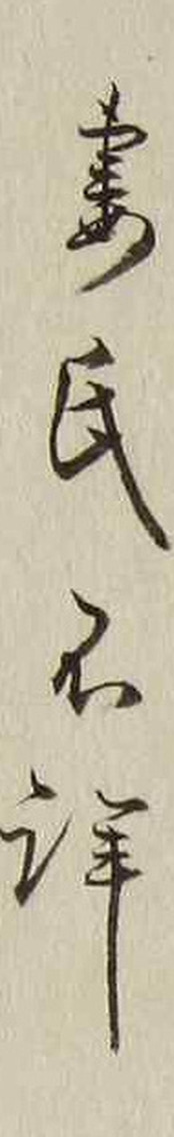妻氏不詳
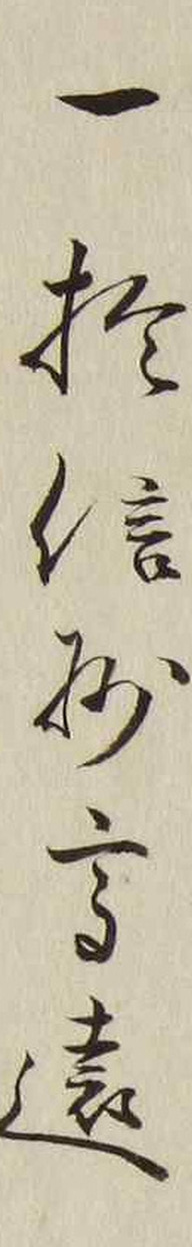一於信州高遠
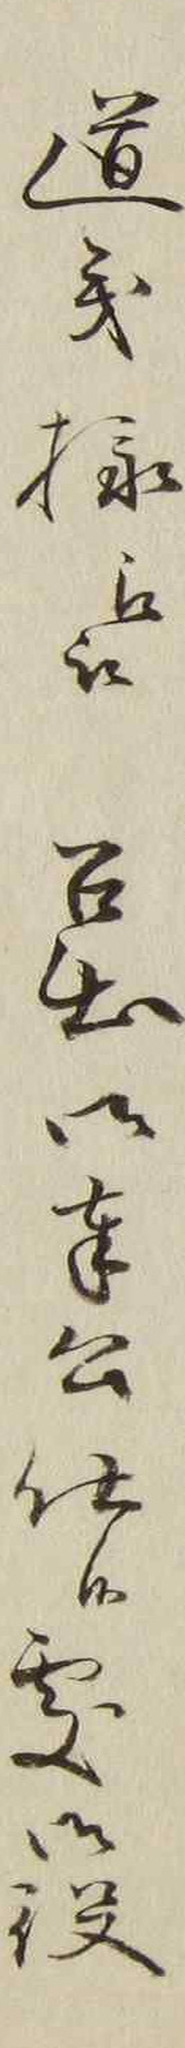道義様江被召出御奉公仕候處御役

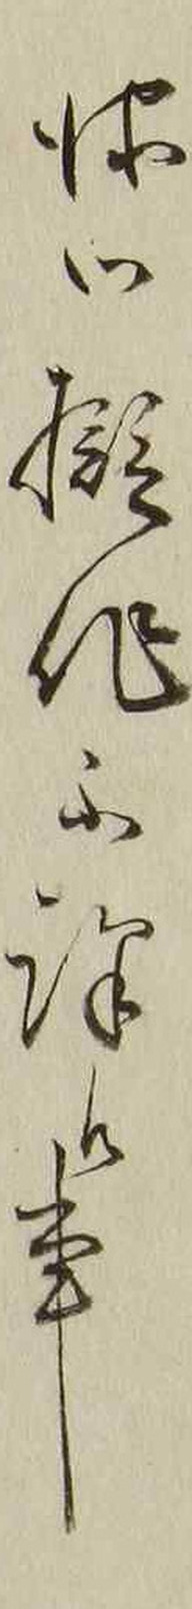衛御擬作不詳候事
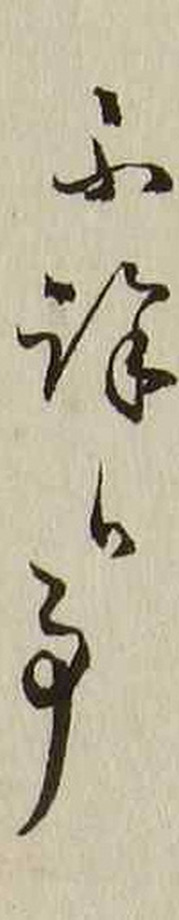不詳候事
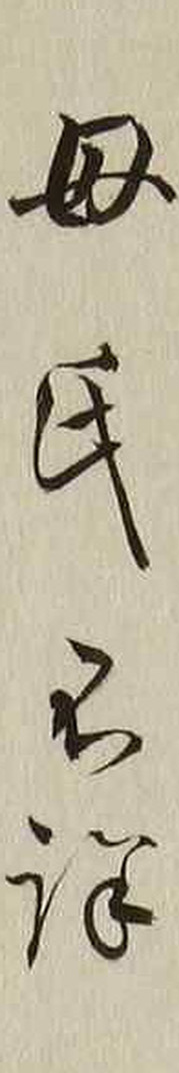母氏不詳
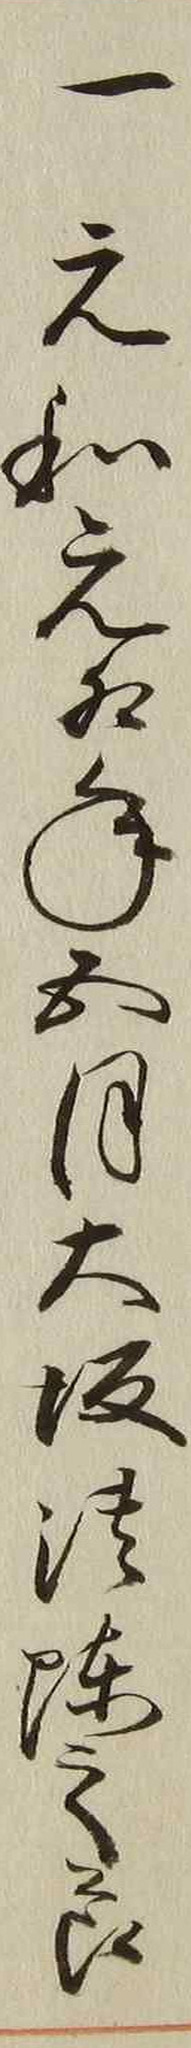一元和元卯年五月大坂御陣之節
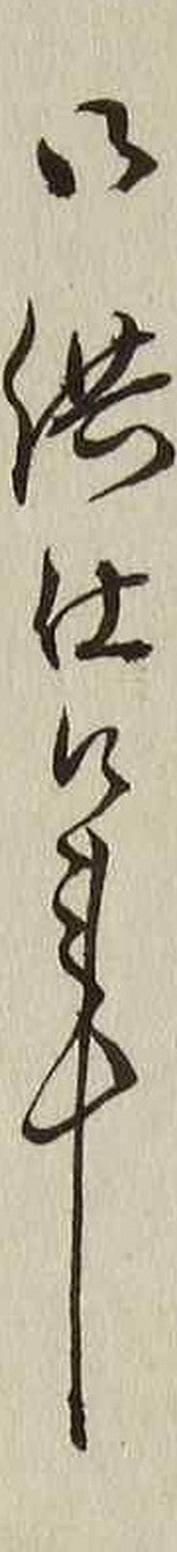御供仕候事
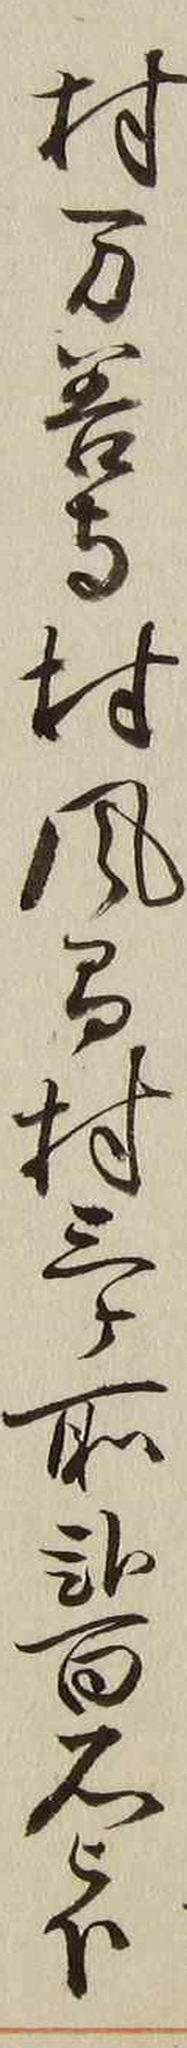村万善寺村風間村三ヶ所弐百石被下
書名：諸士系譜　巻之60　と之部3
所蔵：会津若松市立会津図書館
